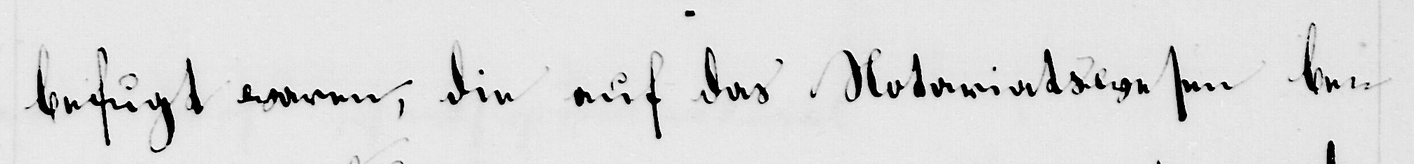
befugt waren, die auf das Notariatswesen be¬
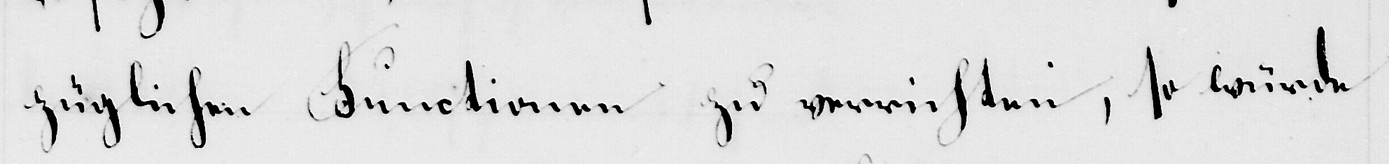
züglichen Functionen zu verrichten, so würde
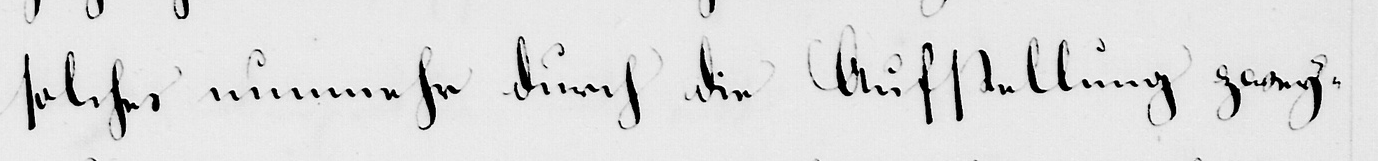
solches nunmehr durch die Aufstellung zwey¬
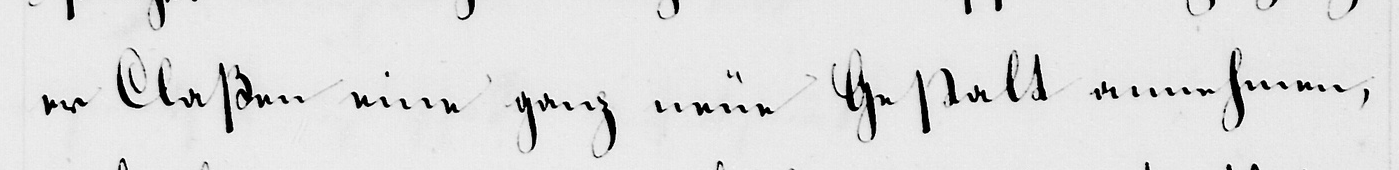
er Claßen eine ganz neue Gestalt annehmen,
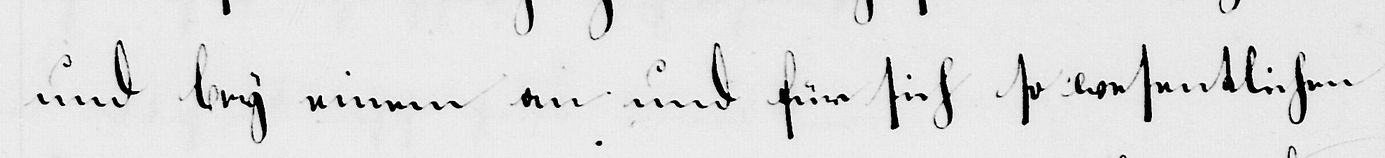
und bey einem an und für sich so wesentlichen
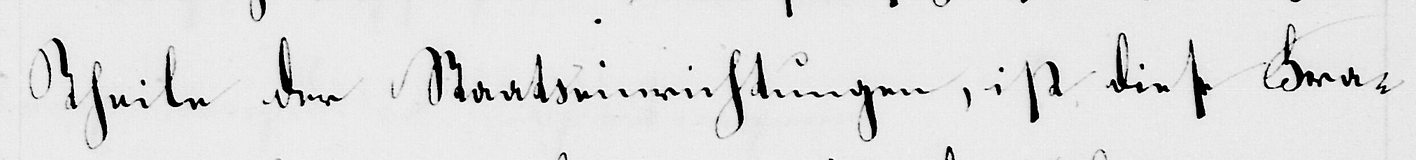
Theile der Staatseinrichtungen, ist diese Fra¬
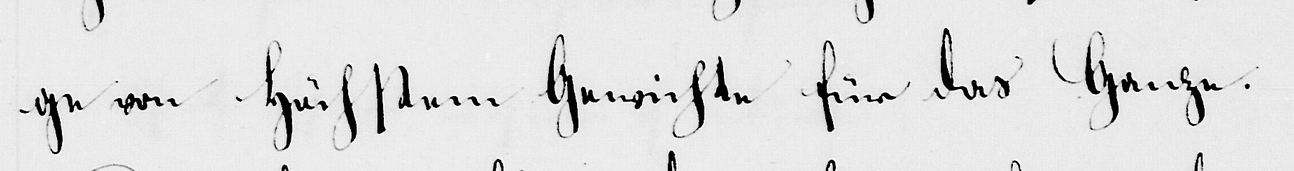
ge von Höchstem Gewichte für das Ganze.
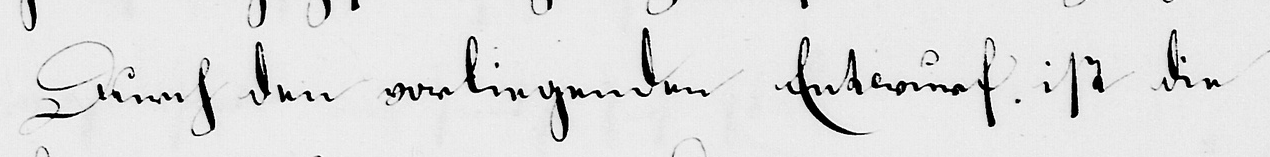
Durch den vorliegenden Entwurf ist die
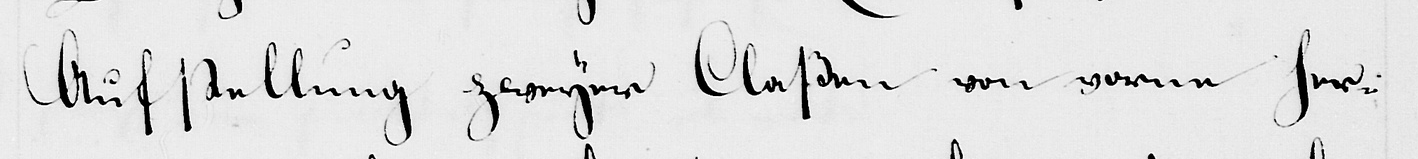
Aufstellung zweyer Claßen von vorne her¬
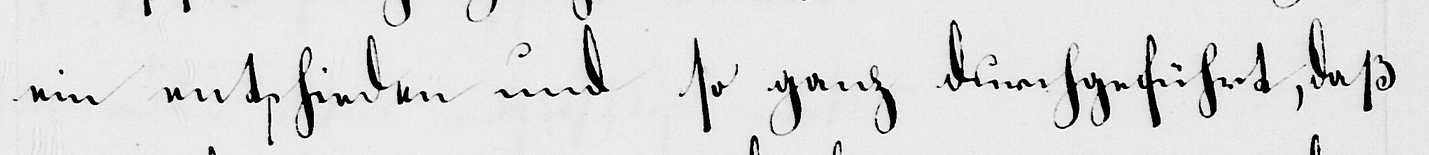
ein entschieden und so ganz durchgeführt, daß
